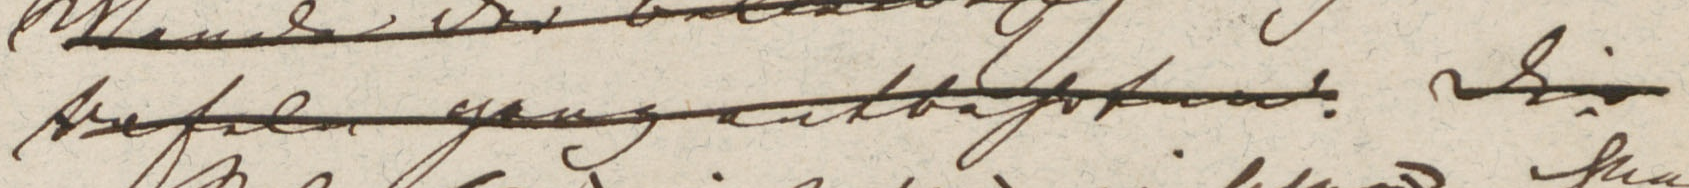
tafeln ganz entbehrten. Die
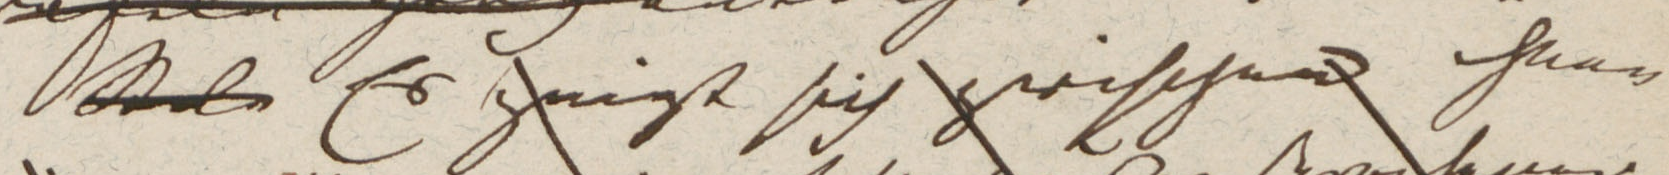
Stel Es zeigt sich zwischen ihnen
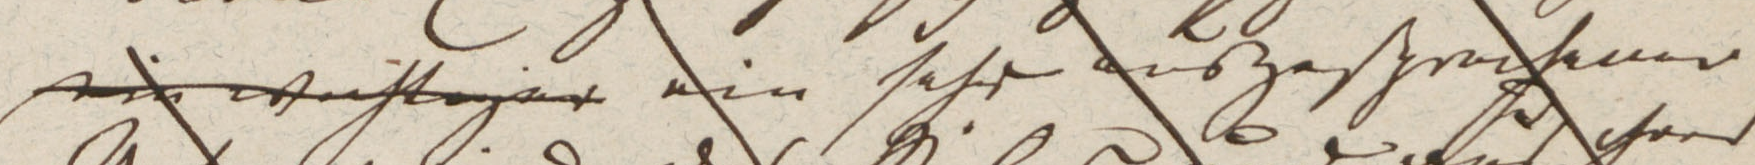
ein wichtiger ein sehr ausgesprochener
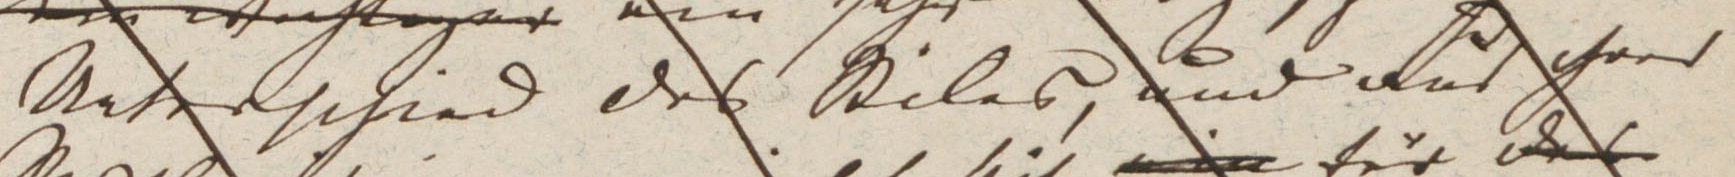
Unterschied des Stiles, und aus ihrer
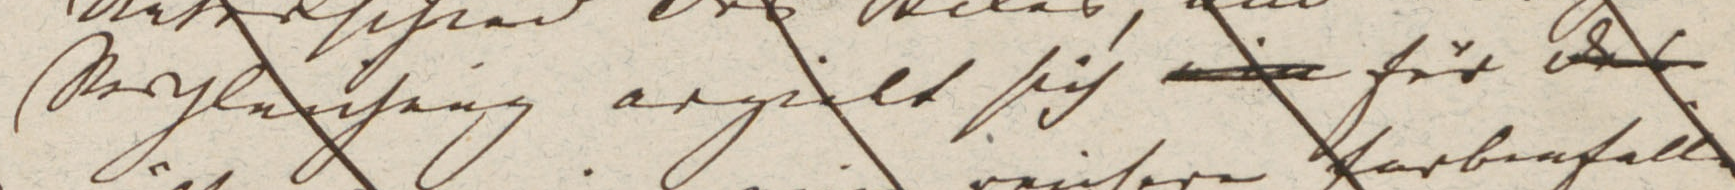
Vergleichung ergiebt sich ein für das
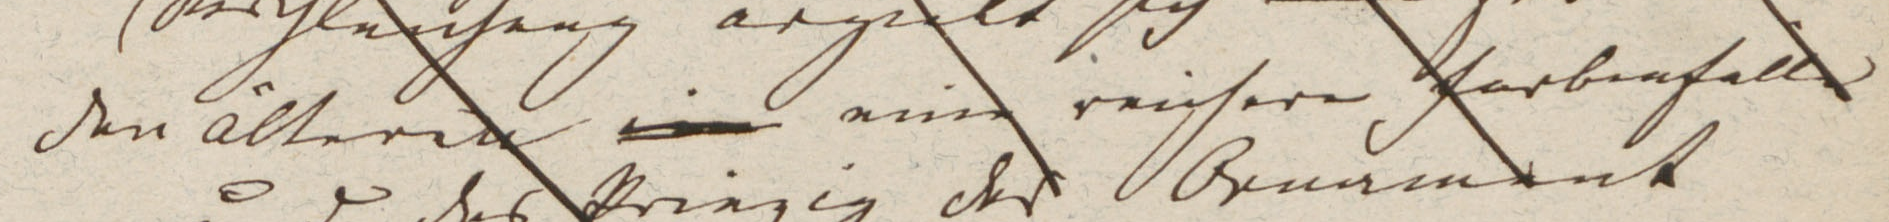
den älteren ein eine reichere Farbenfülle
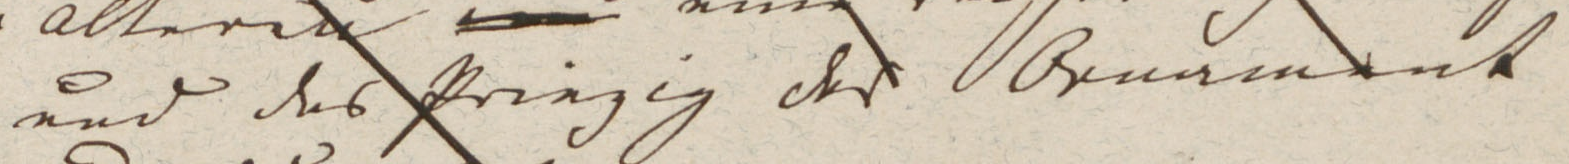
und das Prinzip des Ornament
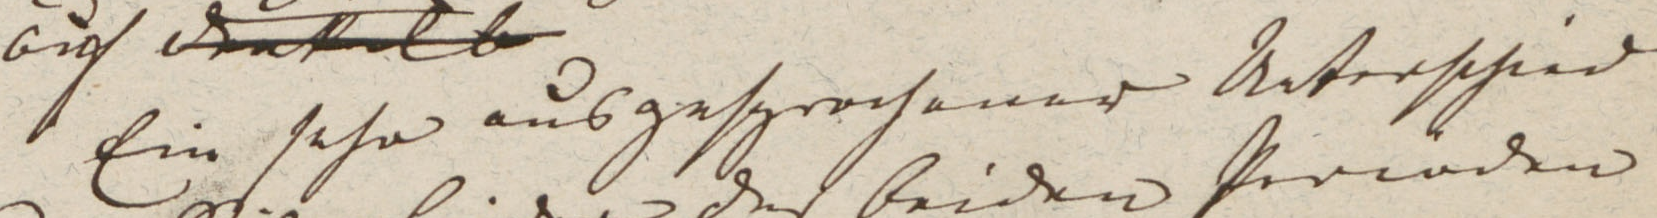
Ein sehr ausgesprochener Unterschied
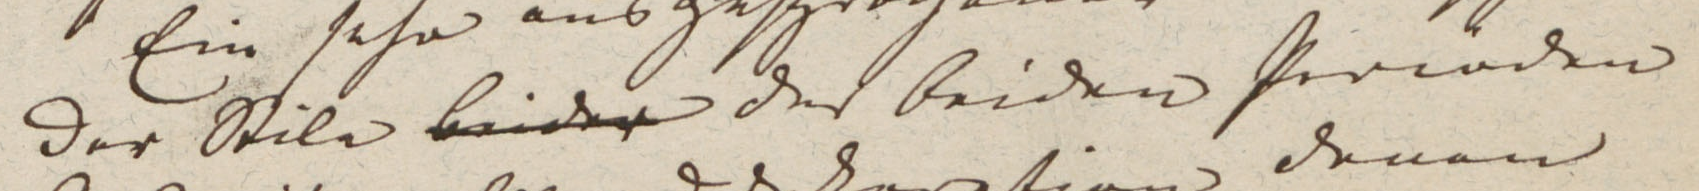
der Stile beider der beiden Perioden
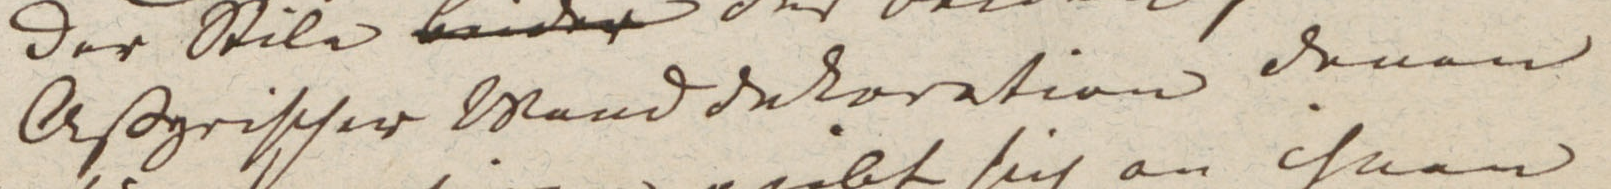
Assyrischer Wanddekoration denen
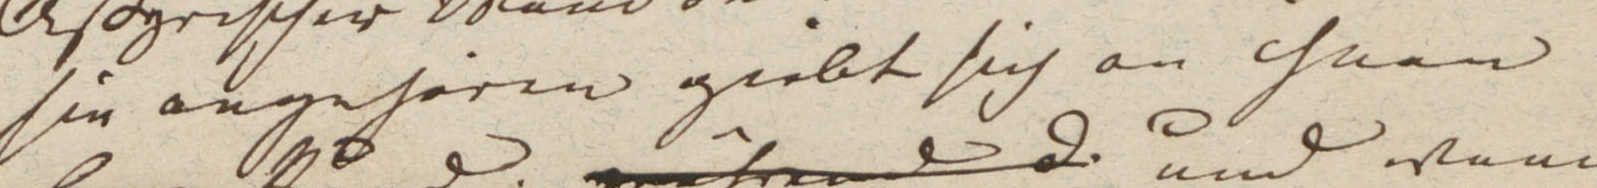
sie angehören giebt sich an ihnen
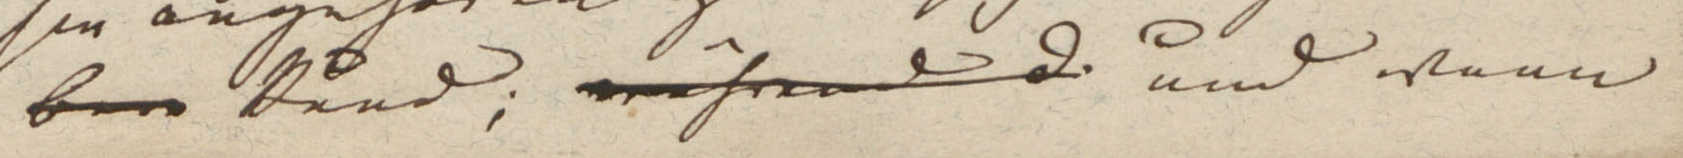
b kund; während d und wenn
